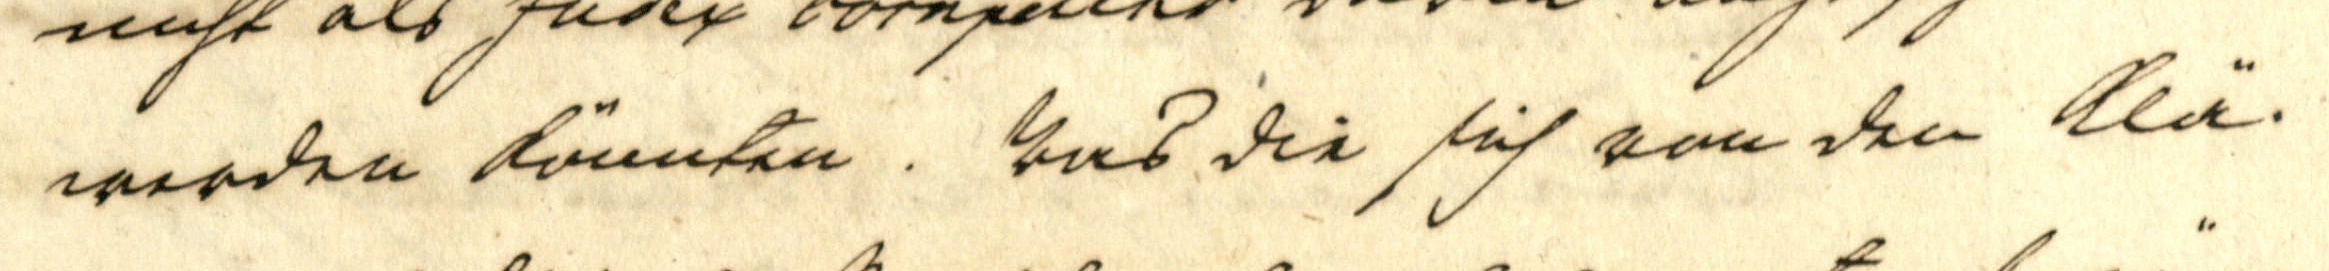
werden könnten. Was die sich von den Klä¬
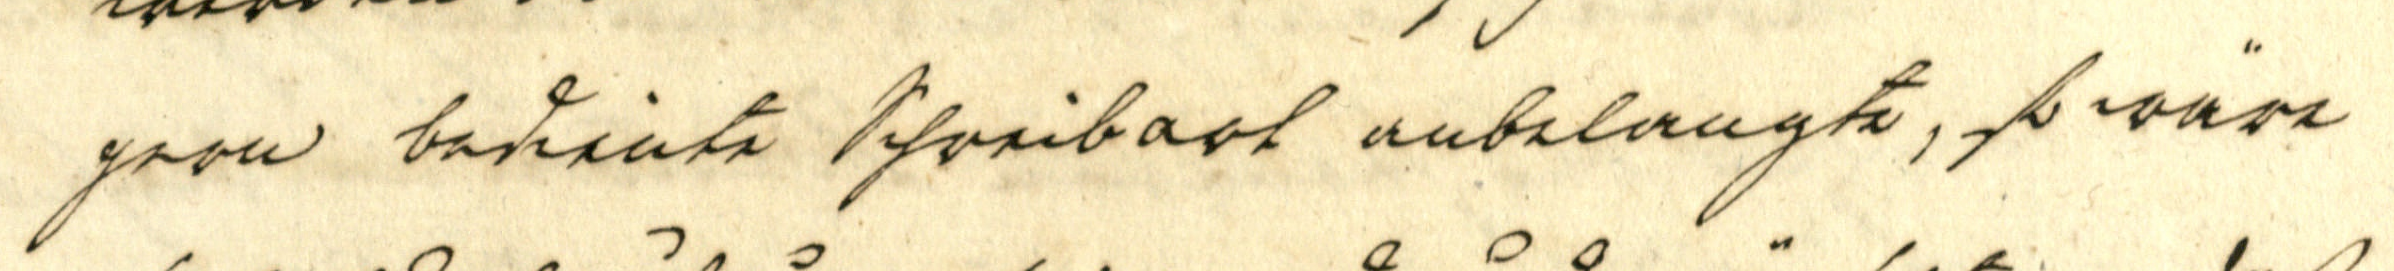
gern bediente Schreibart anbelangte, so wäre
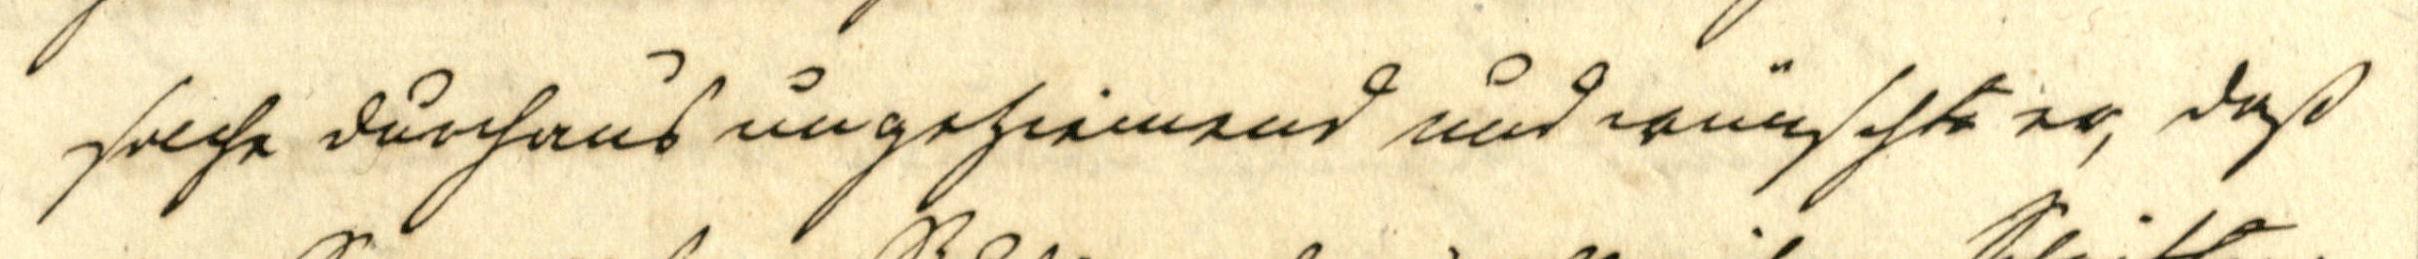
solche durchaus ungeziemend und wünschte er, daß
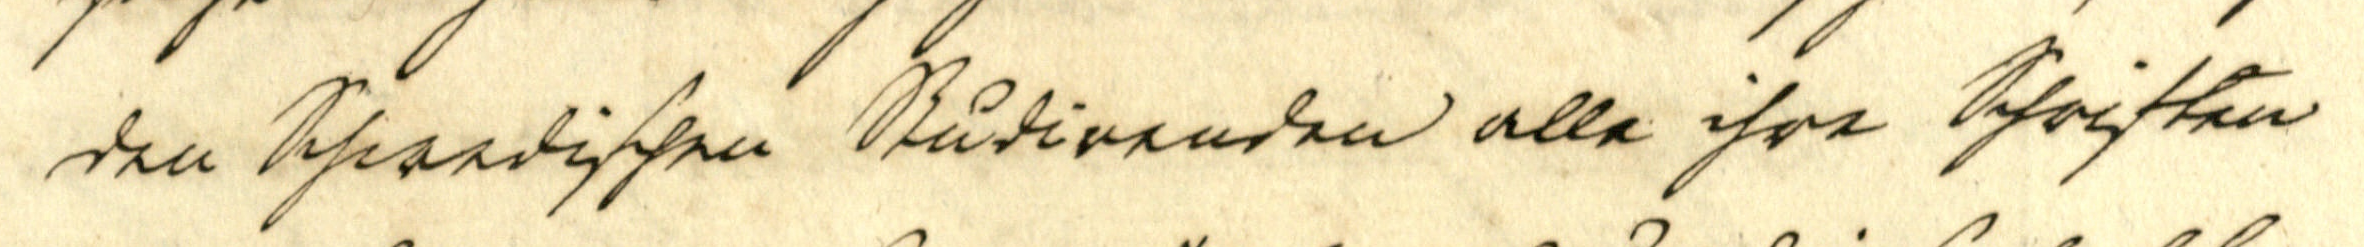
den Schwedischen Studirenden alle ihre Schriften
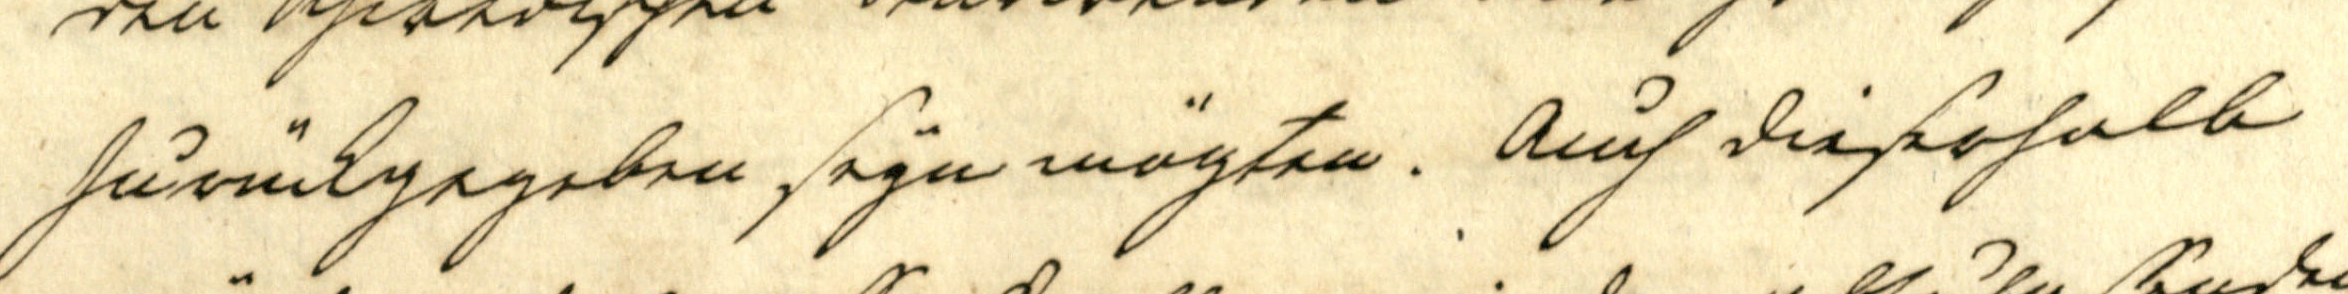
zurückgegeben seÿn mögten. Auch dieserhalb
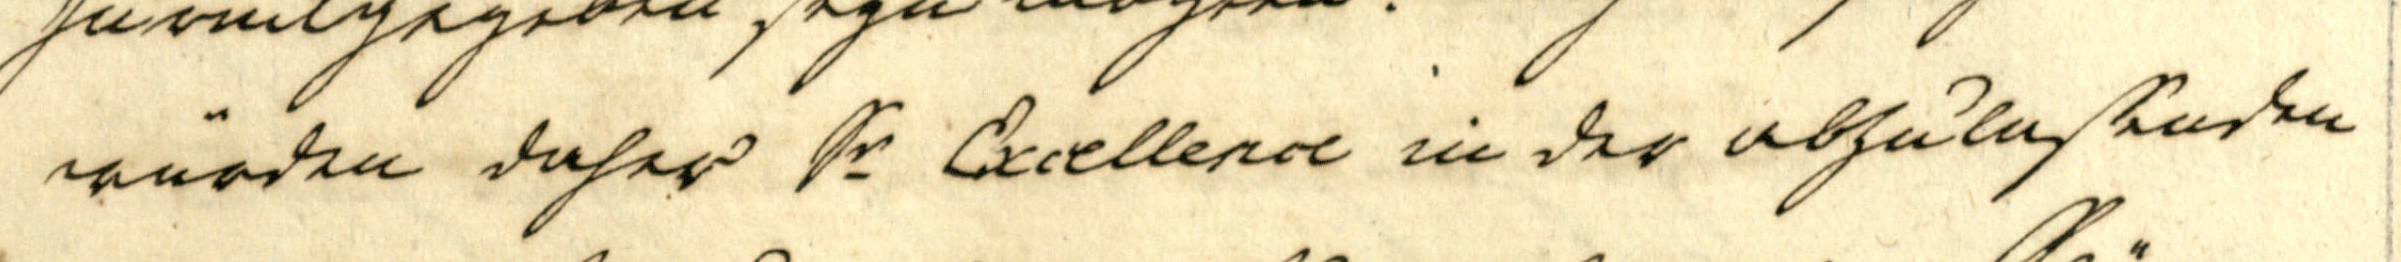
würden daher Sr Excellence in der abzulassenden
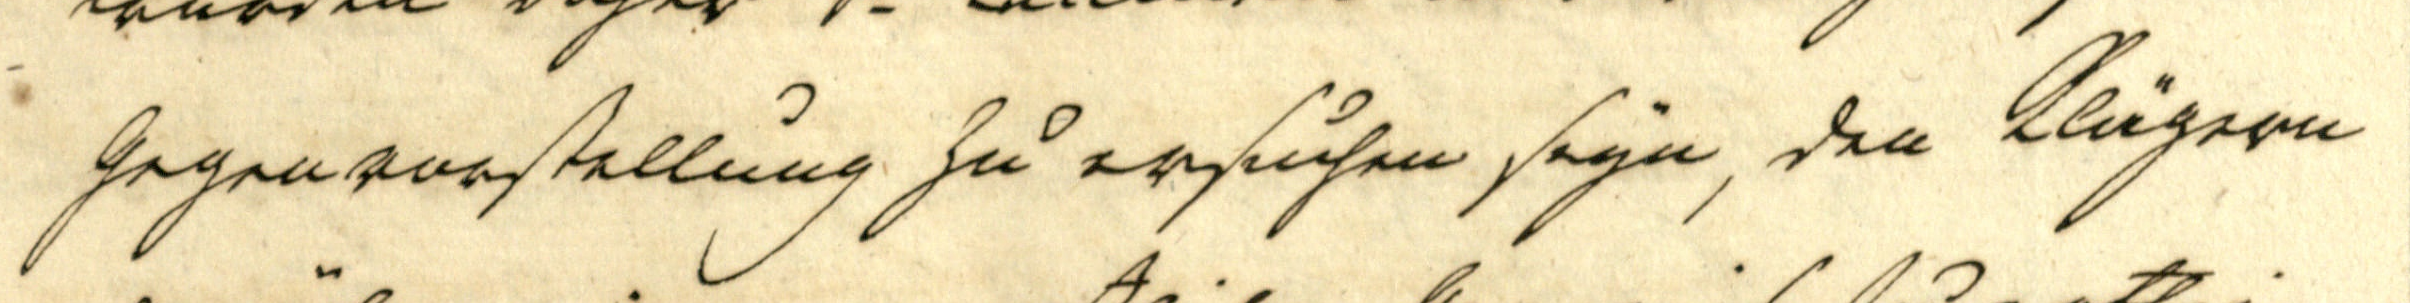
Gegenvorstellung zu ersuchen seÿn, den Klägern
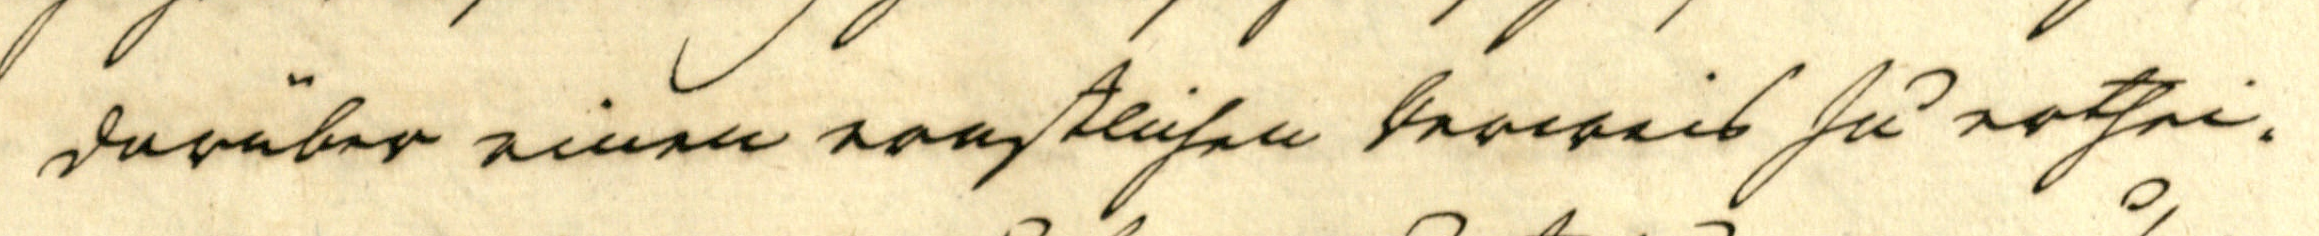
darüber einen ernstlichen Verweis zu erthei¬
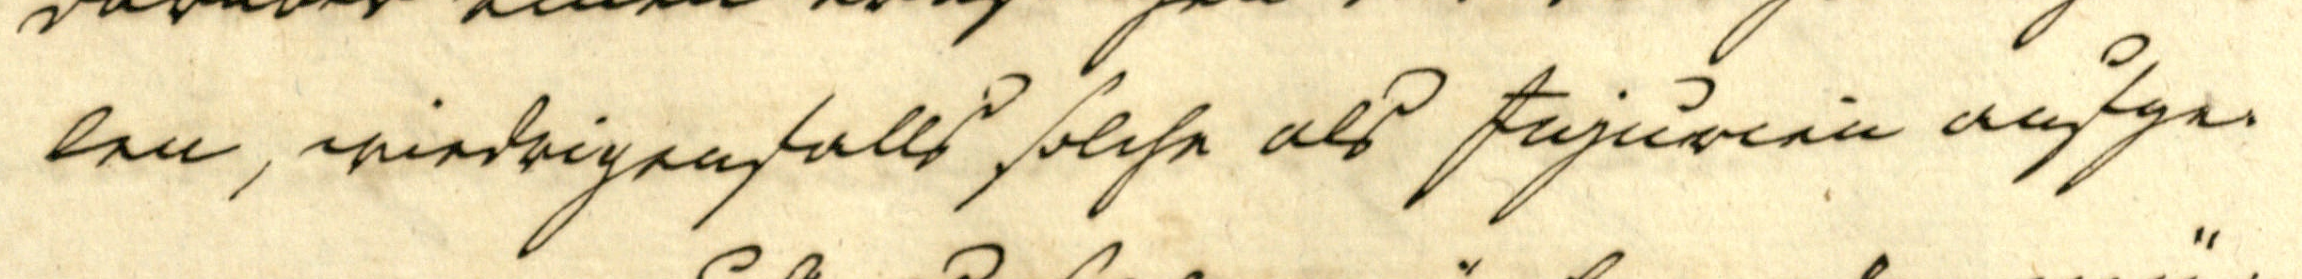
len, wiedrigenfalls solche als Injurien aufge¬
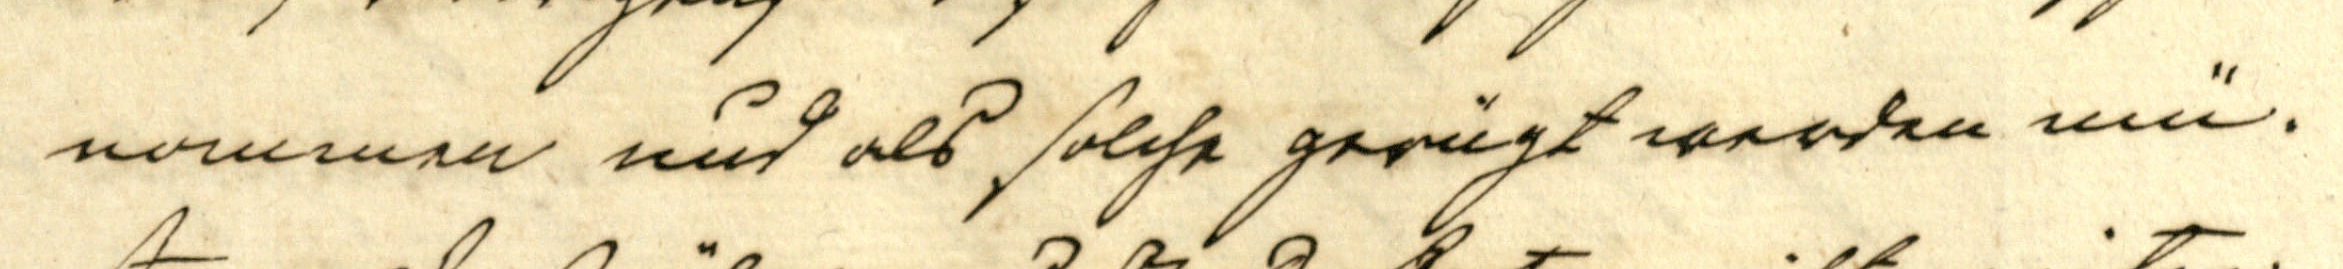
nommen und als solche gerügt werden mü¬
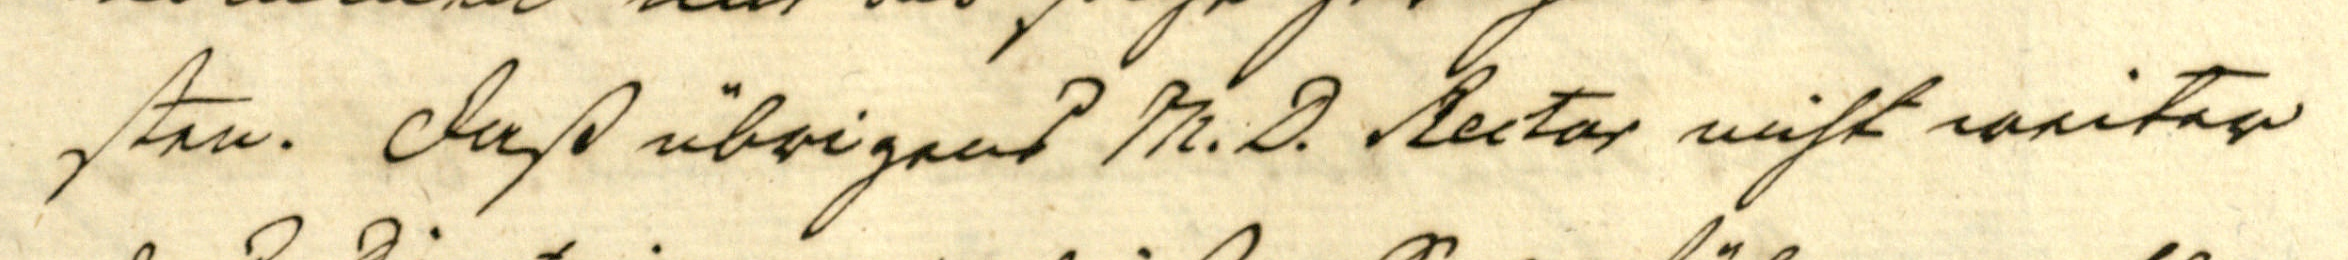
sten. Daß übrigens M. D. Rector nicht weiter
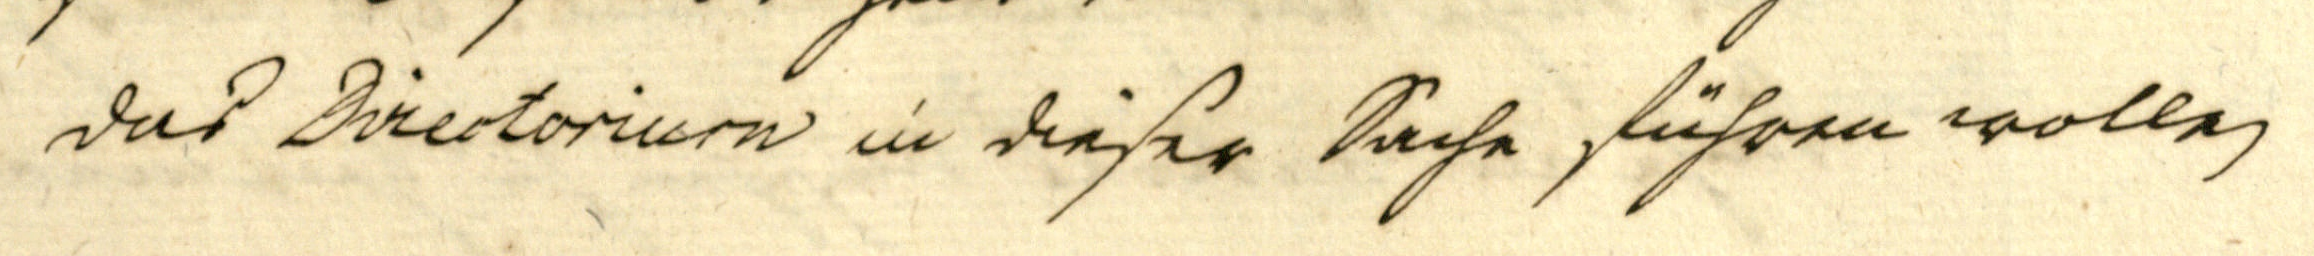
das Directorium in dieser Sache führen wolle,
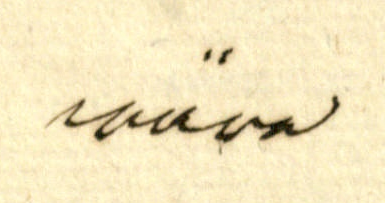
wäre
